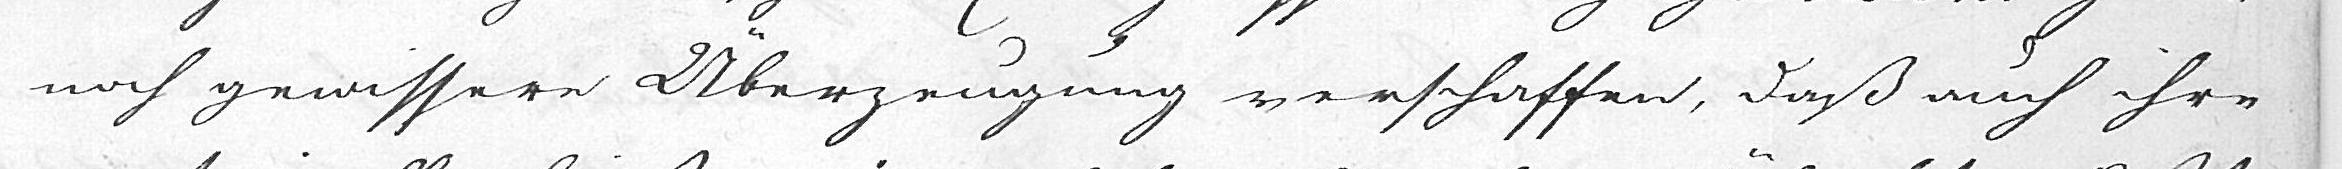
noch gewissere Überzeugung verschaffen, daß auch ihre
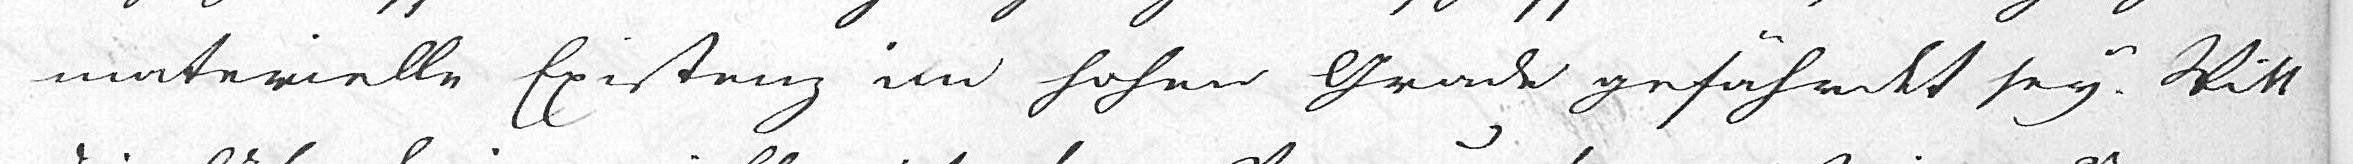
materielle Existenz und hohen Grade gefährdet sey. Will
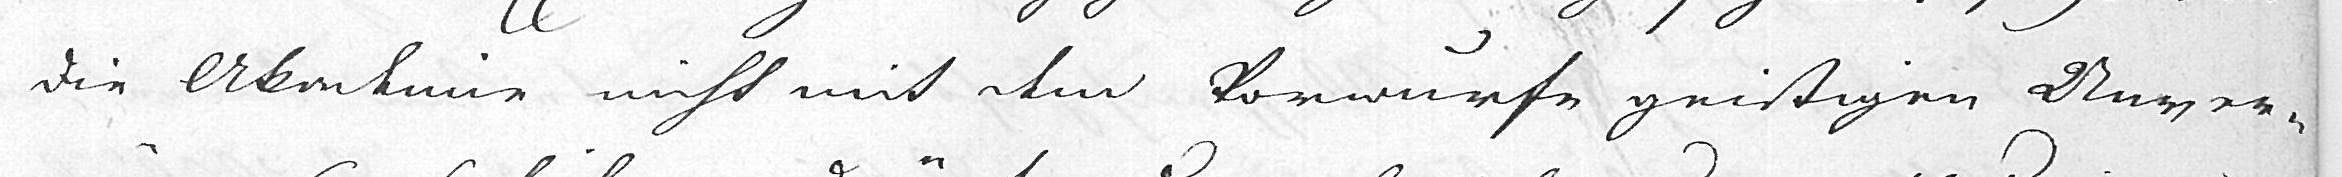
die Akademie nicht mit dem Vorwurfe geistigen Unver-
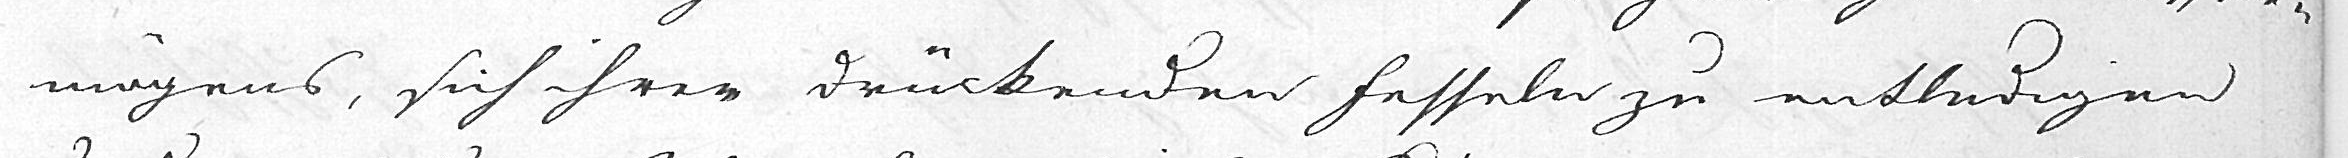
mögens, sich ihrer drückenden Fesseln zu entledigen
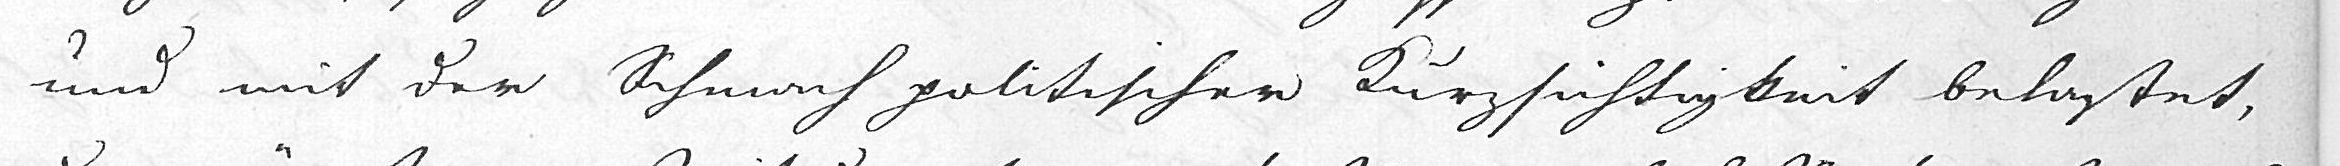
und mit der Schmach politischer Kurzsichtigkeit belastet,
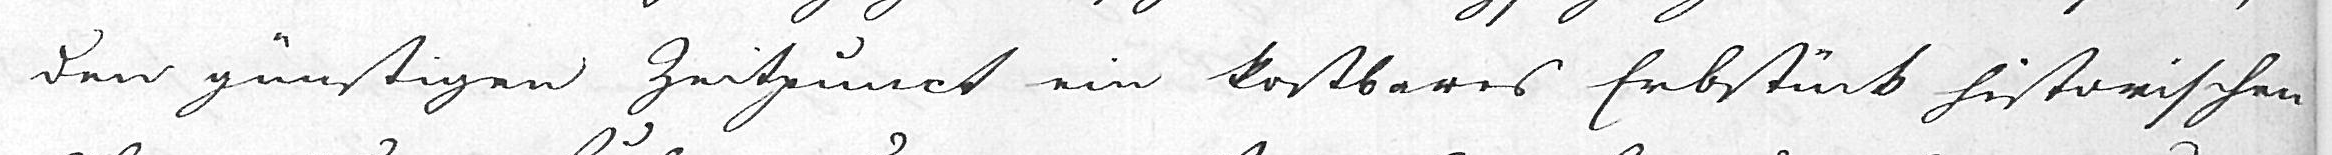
den günstigen Zeitpunct ein kostbares Erbstück historischen
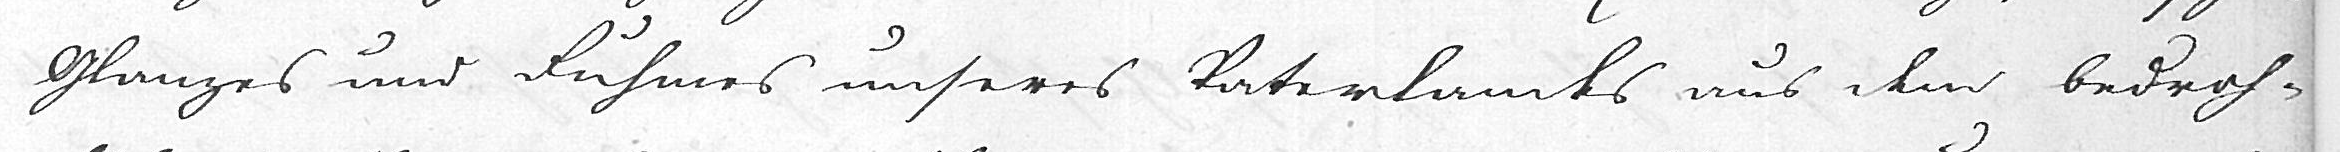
Glanzes und Ruhmes unseres Vaterlandes aus dem bedroh-
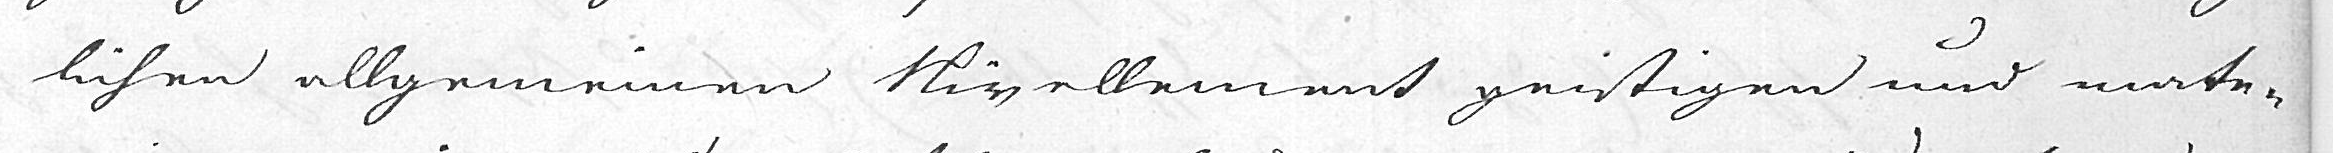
lichen allgemeinen Nivellement geistigen und mate-
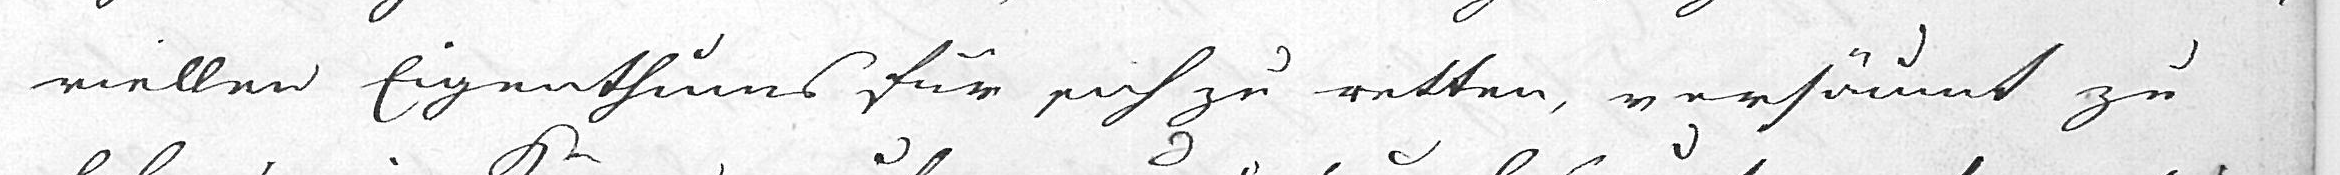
riellen Eigenthums für sich zu retten, versäumt zu
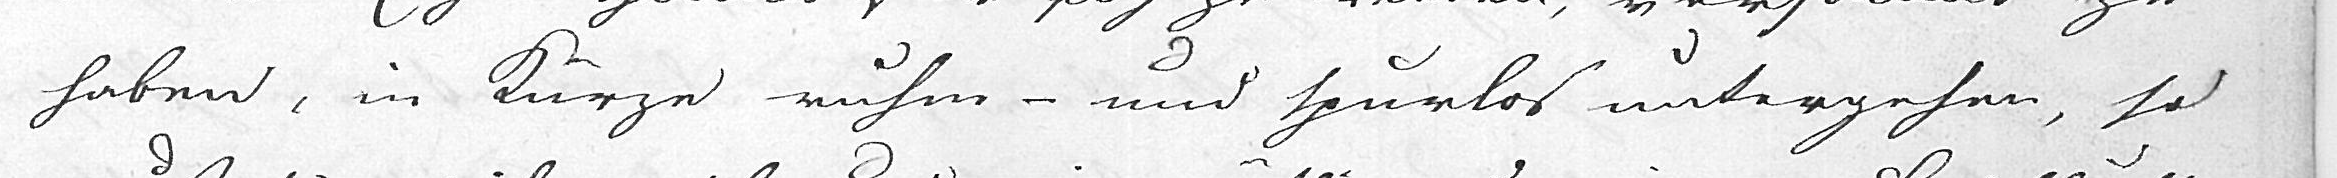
haben, in Kürze ruhm- und spurlos untergehen, so
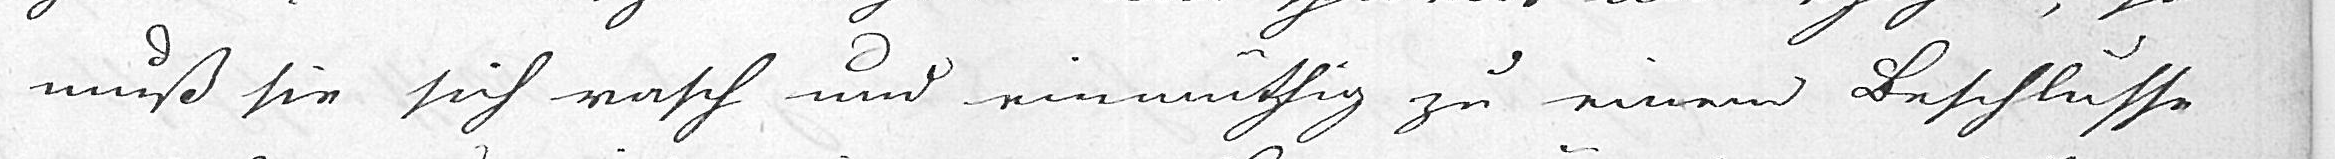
muß sie sich rasch und einmüthig zu einem Beschlusse
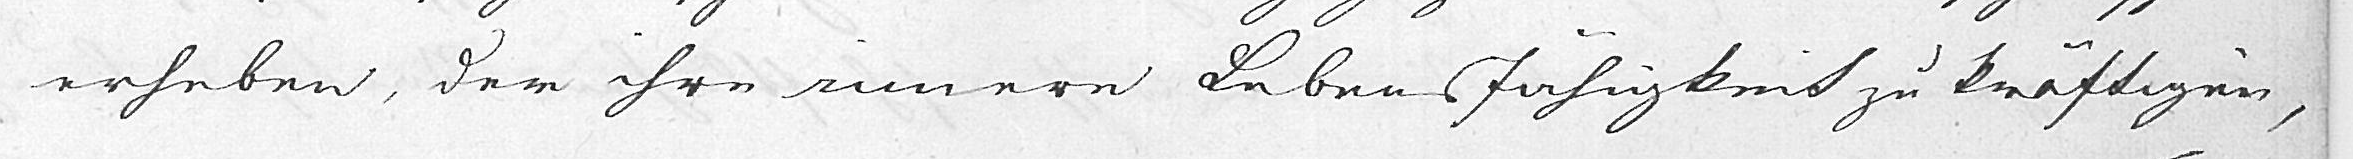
erheben, der ihre immer Lebensfähigkeit zu kräftigen,
